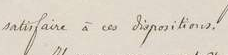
satisfaire à ces dispositions.
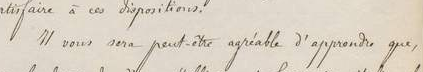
Il vous sera peut-être agréable d'apprendre que,
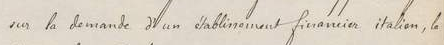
sur la demande d'un établissement financier italien, le
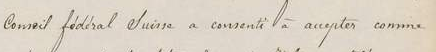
Conseil fédéral Suisse a consenti à accepter comme
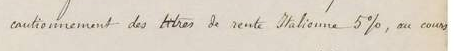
cautionnement des titres de rente Italienne 5%, au cours
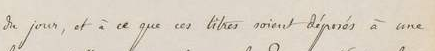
du jour, et à ce que ces titres soient déposés à une
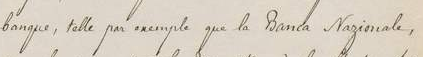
banque, telle par exemple que la Banca Nazionale,
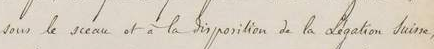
sous le sceau et à la disposition de la Légation Suisse,
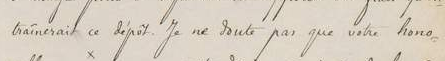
traînerait ce dépôt. Je ne doute pas que votre hono-
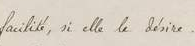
facilité, si elle le désire.
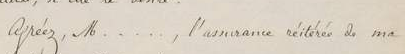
Agréez, M...., l'assurance réitérée de ma
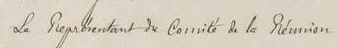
Le Représentant du Comité de la Réunion
